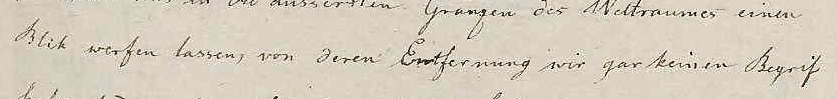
Blik werfen lassen, von deren Entfernung wir gar keinen Begrif
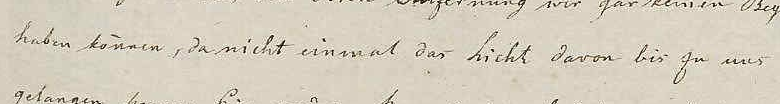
haben können, da nicht einmal das Licht davon bis zu uns
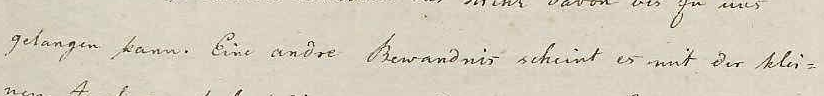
gelangen kann. Eine andre Bewandnis scheint es mit der klei-
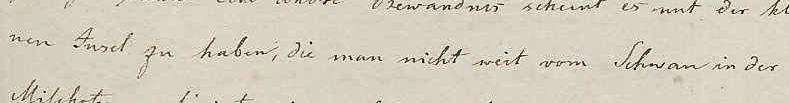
nen Insel zu haben, die man nicht weit vom Schwan in der
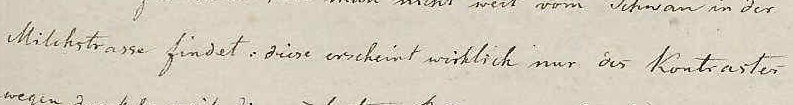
Milchstrasse findet: diese erscheint wirklich nur des Kontrastes
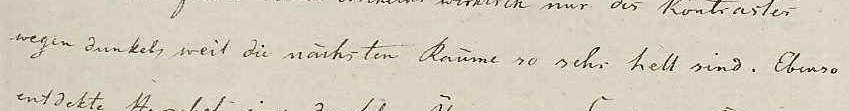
wegen dunkel, weil die nächsten Räume so sehr hell sind. Ebenso
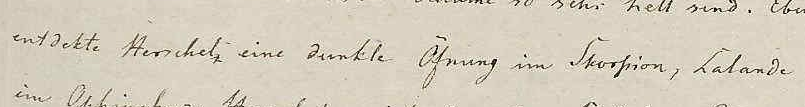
entdekte Herschel , eine dunkle Öfnung im Skorpion, Lalande
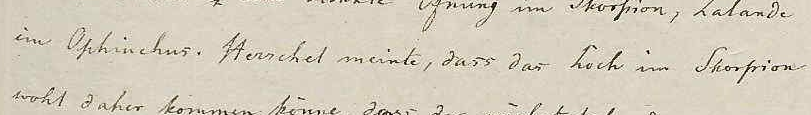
im Ophiuchus. Herschel meinte, dass das Loch im Skorpion
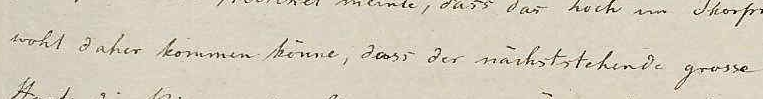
wohl daher kommen könne, dass der nächststehende grosse
